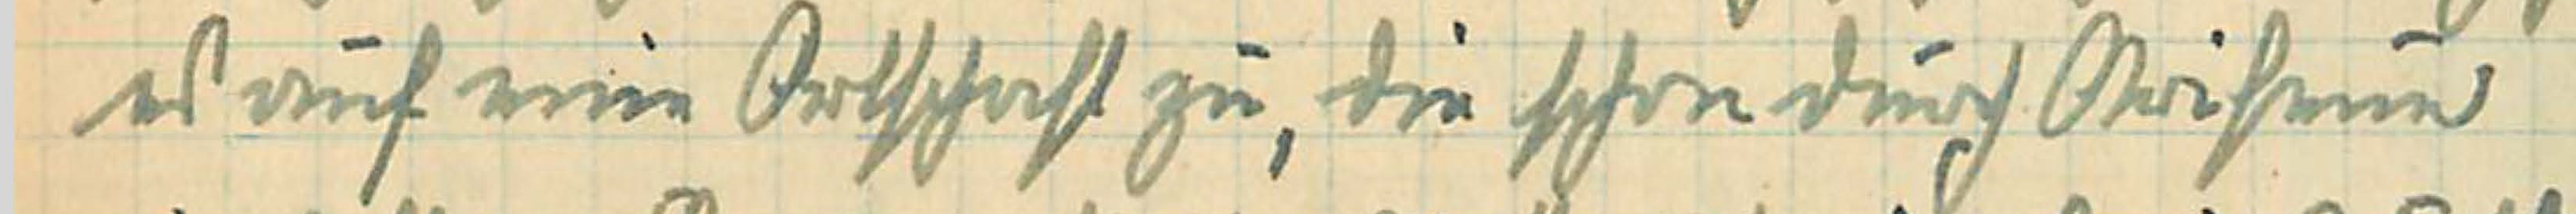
es auf eine Ortschaft zu, die schon durch Arifeuer
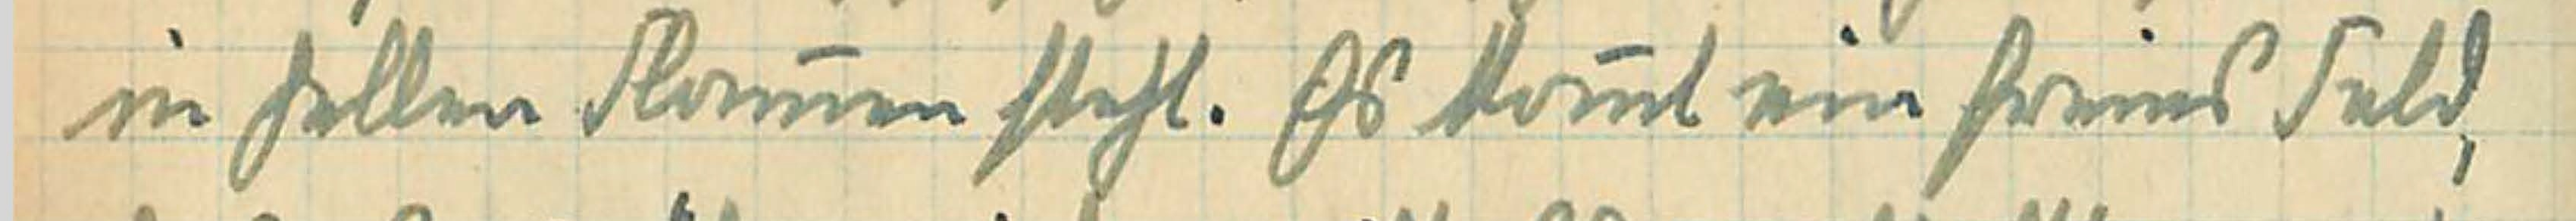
in hellen Flammen steht. Es kommt ein freies Feld,
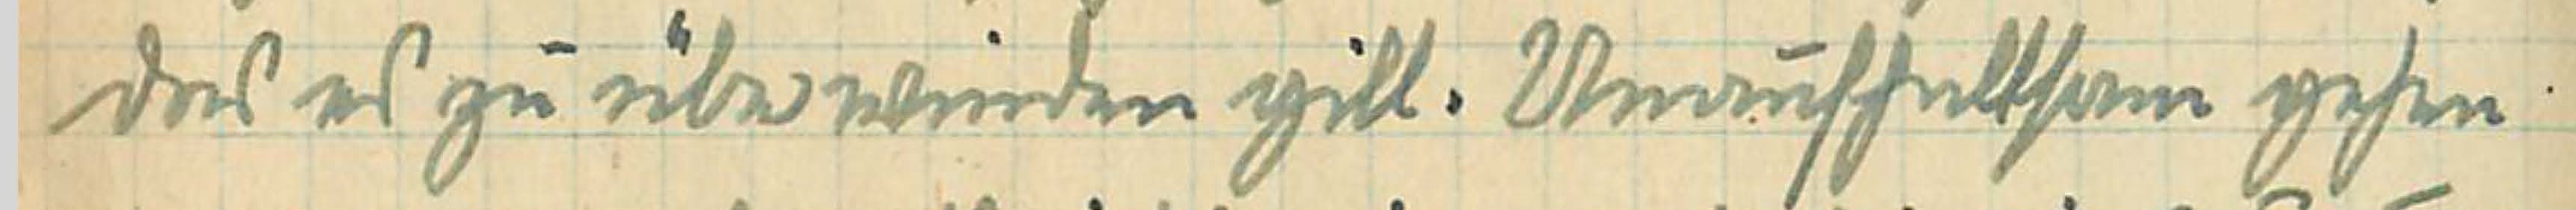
das es zu überwinden gilt. Unaufhaltsam gehen
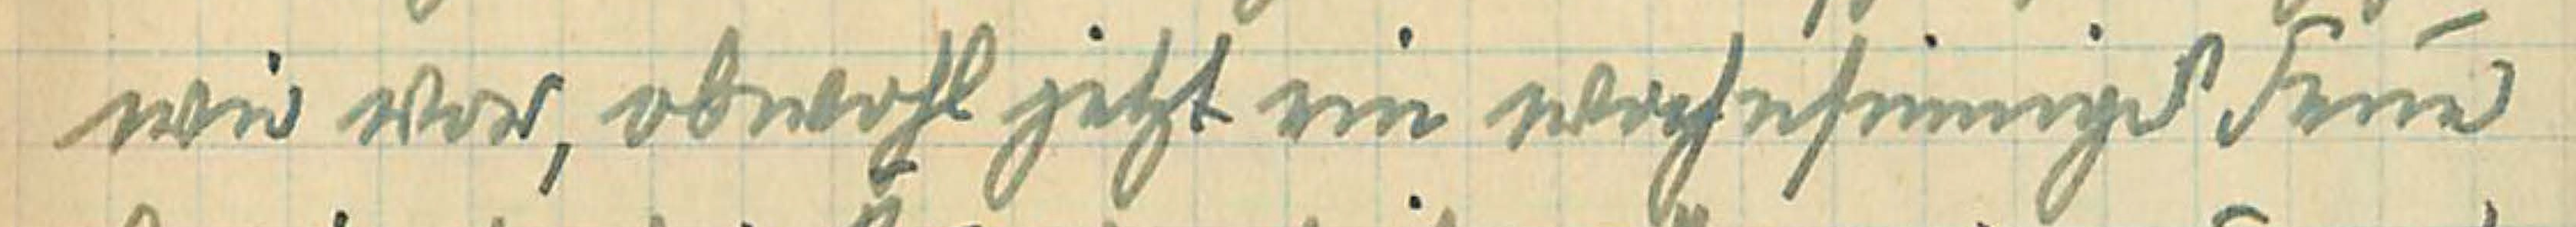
wir vor, obwohl jetzt ein wahnsinniges Feuer
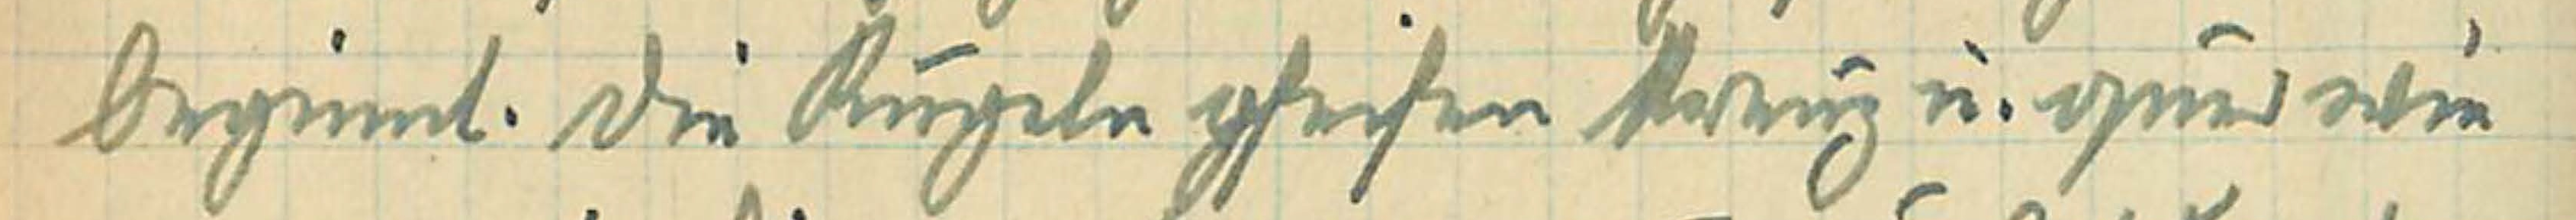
beginnt. Die Kugeln pfeifen kreuz u. quer wie
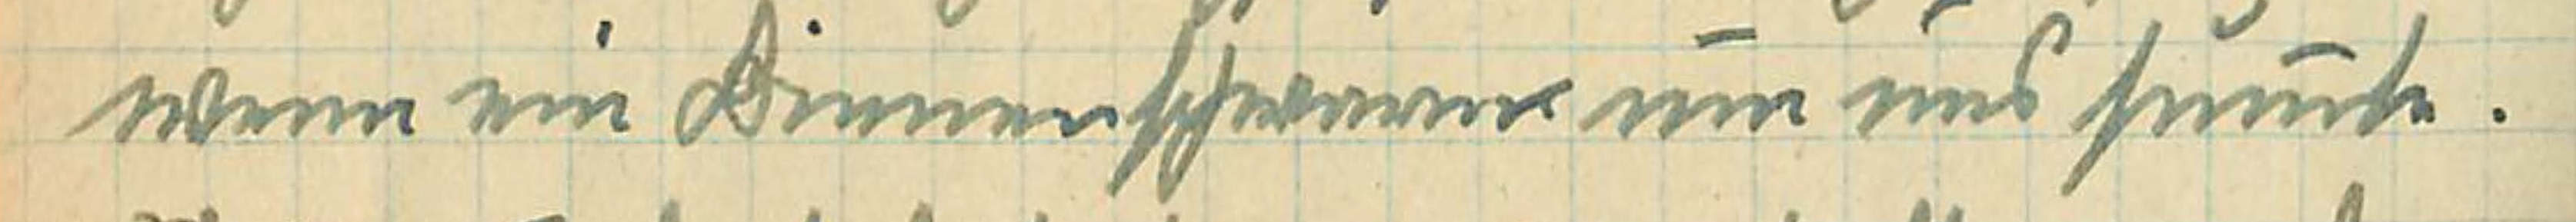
wenn ein Bienenschwarm um uns summte.
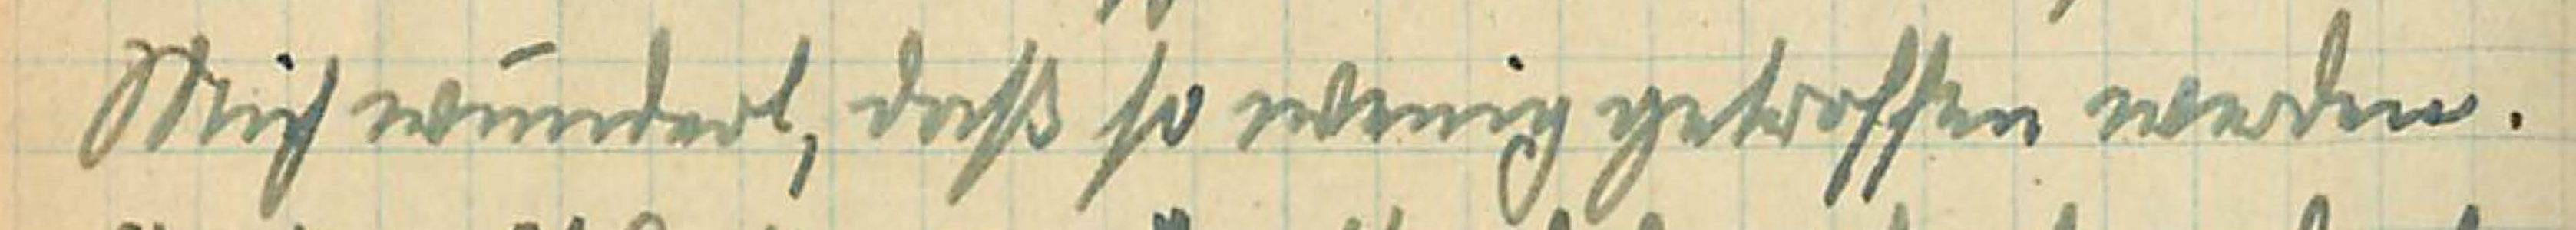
Mich wundert, daß so wenig getroffen werden.
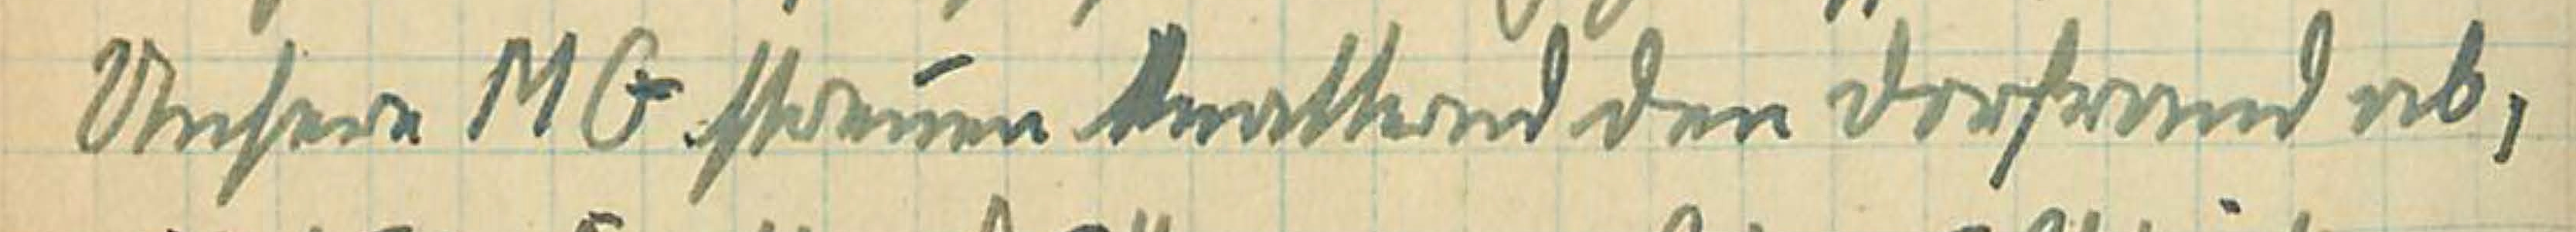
Unsere MG streuen knatternd den Dorfrand ab,
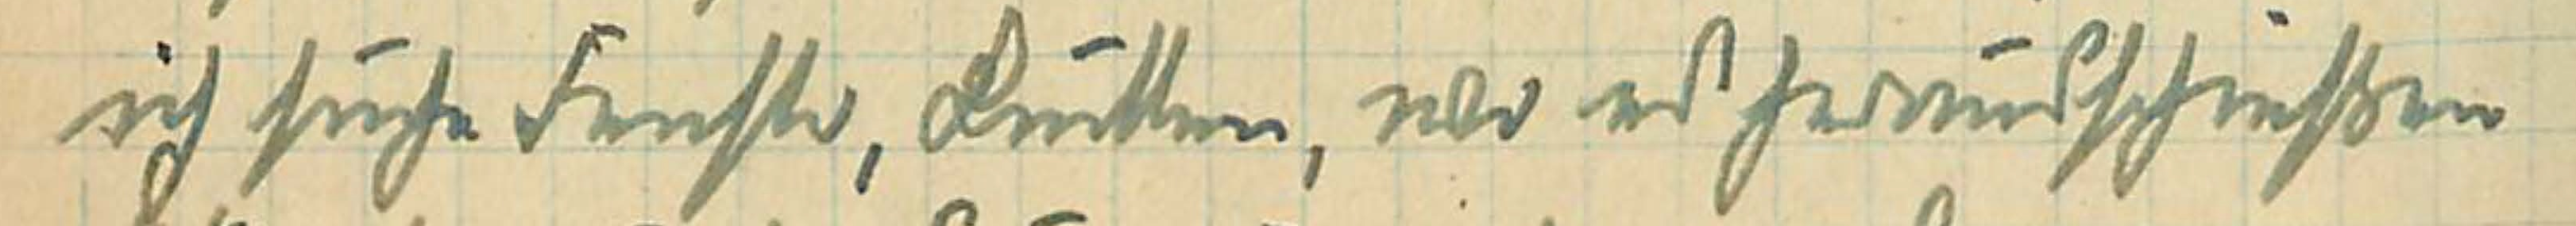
ich suche Fenster, Lücken, wo es herausschießen
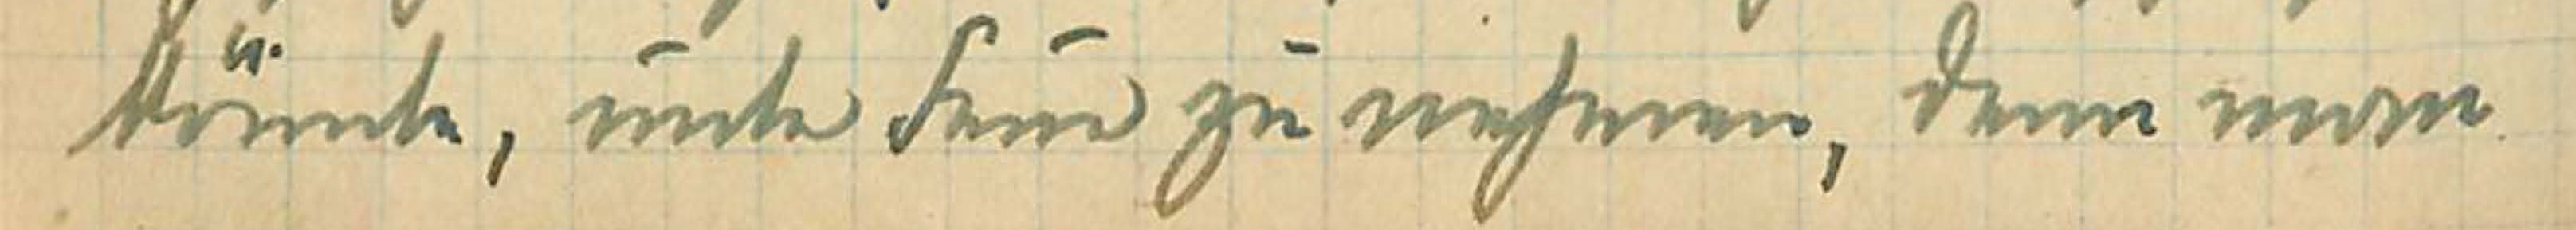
könnte, unter Feuer zu nehmen, denn man
